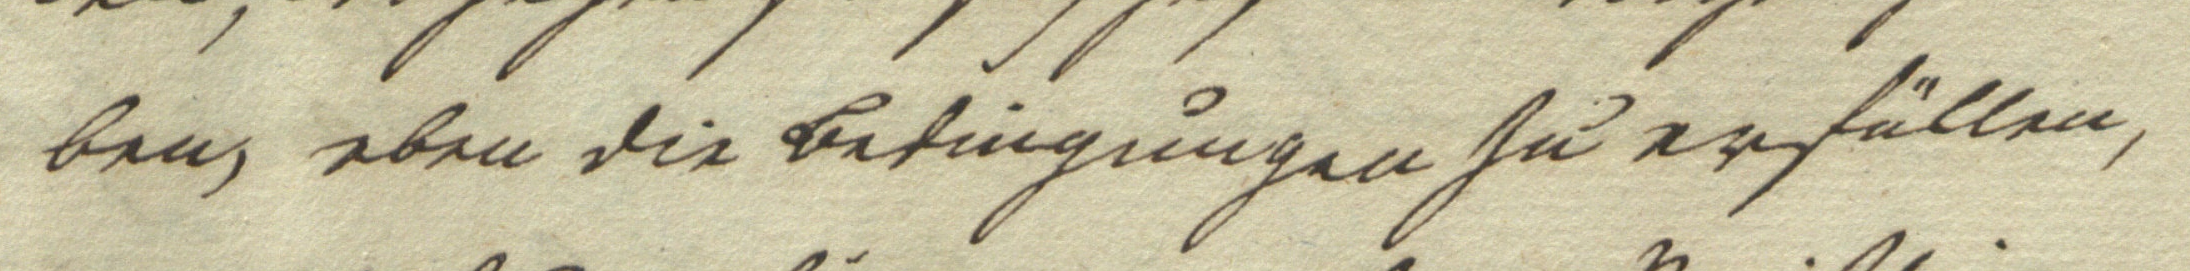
ben, eben die Bedingungen zu erfüllen,
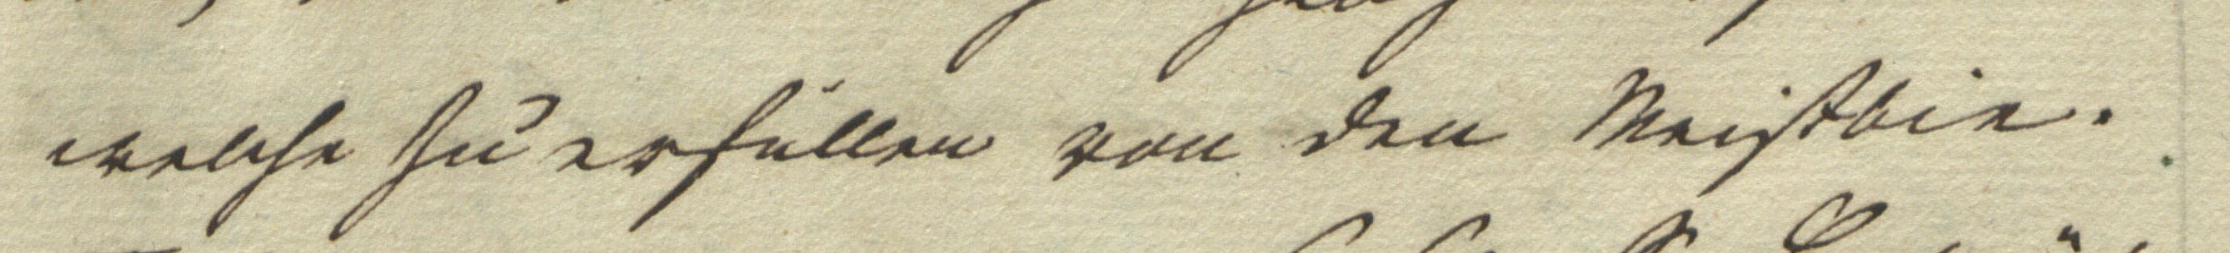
welche zu erfüllen von den Meistbie¬
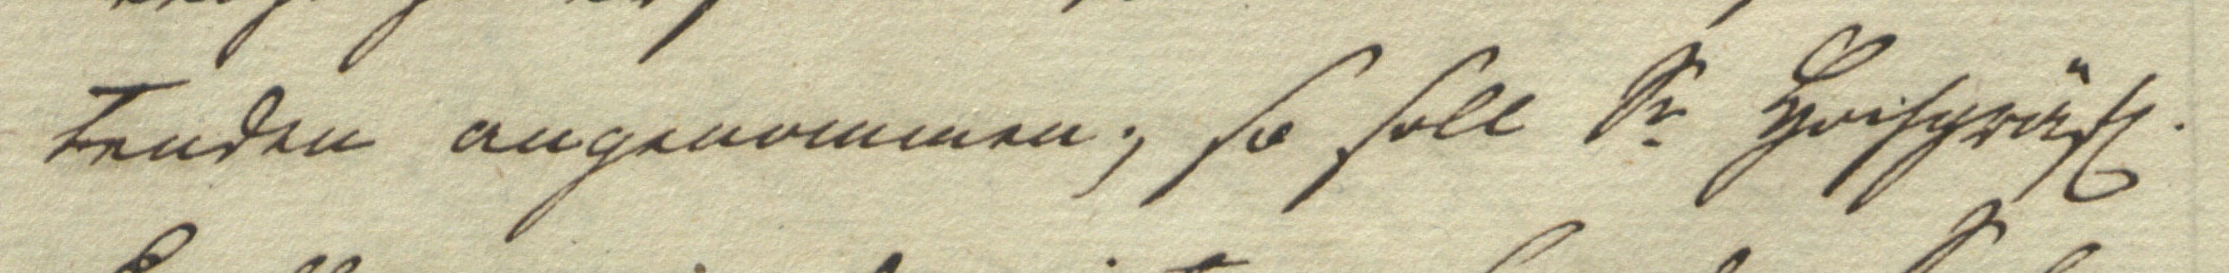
tenden angenommen; so soll Sr Hochgräfl.
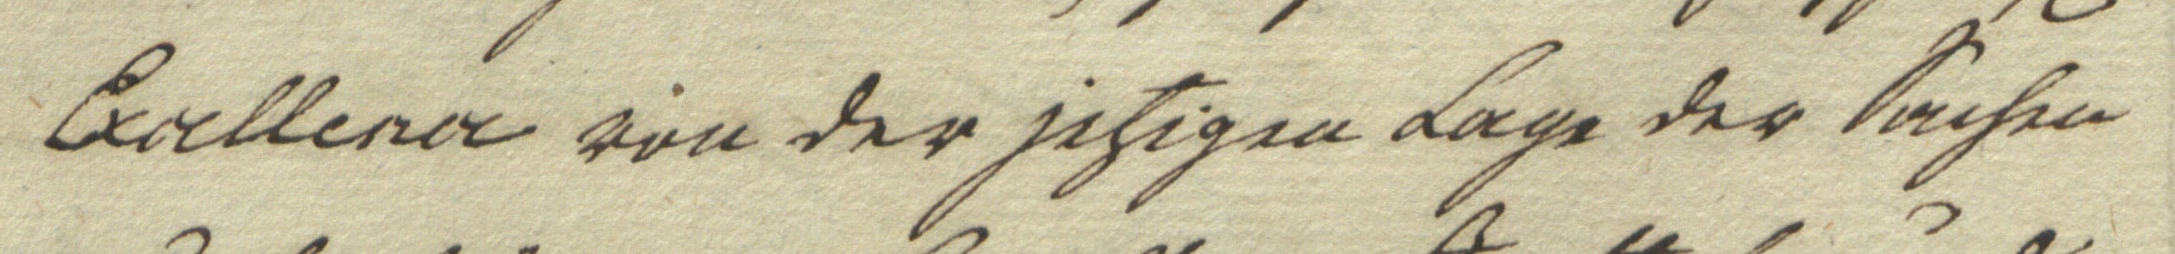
Excellence von der jetzigen Lage der Sachen
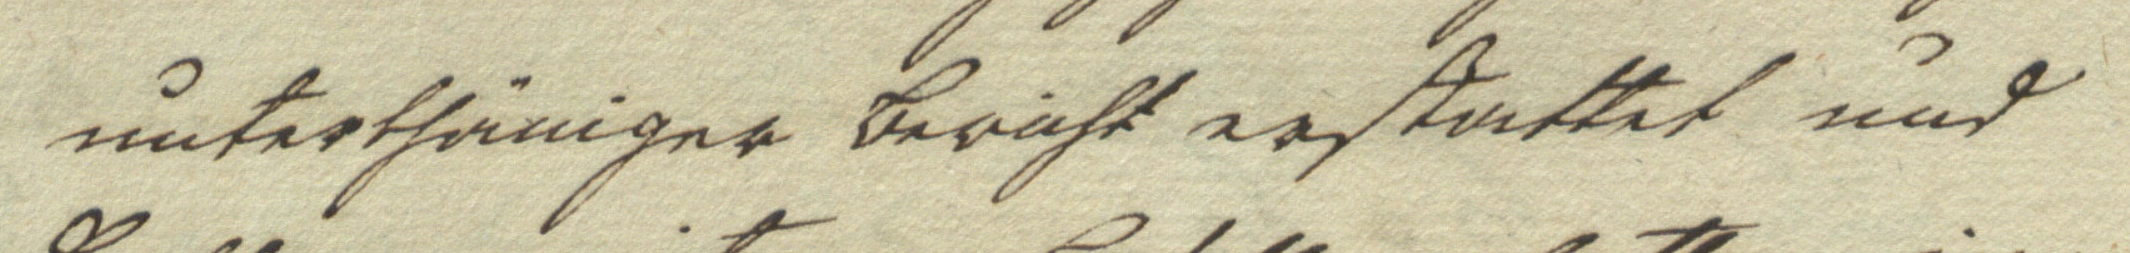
unterthäniger Bericht erstattet und
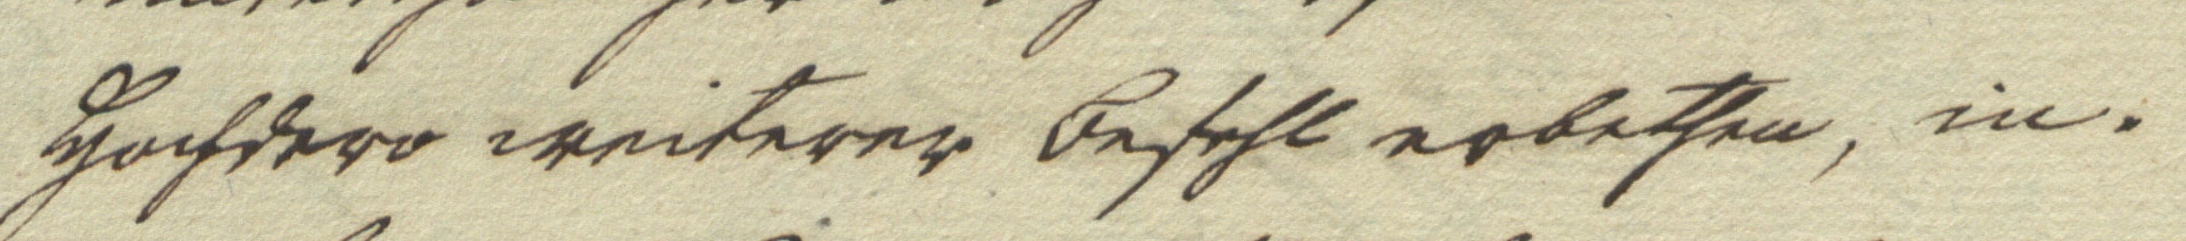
Hochdero weiteren Befehl erbethen, in¬
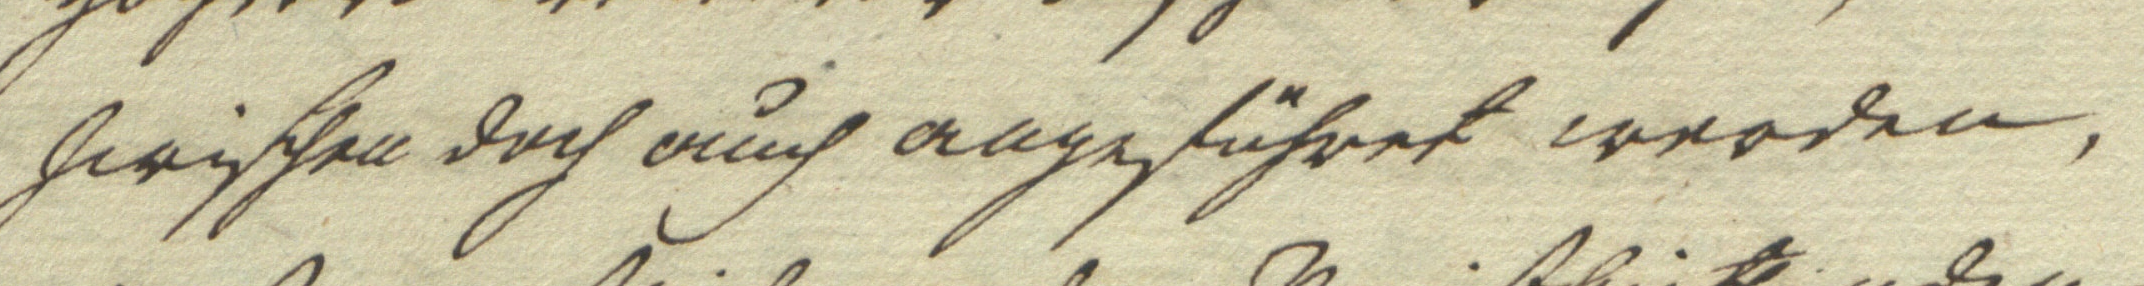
zwischen doch auch angeführet werden,
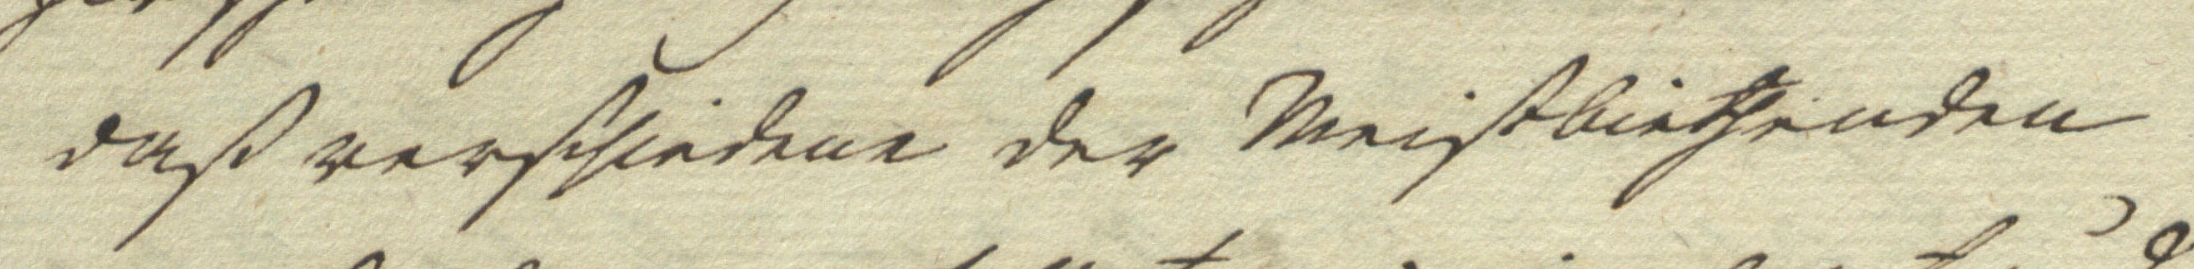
daß verschiedene der Meistbiethenden
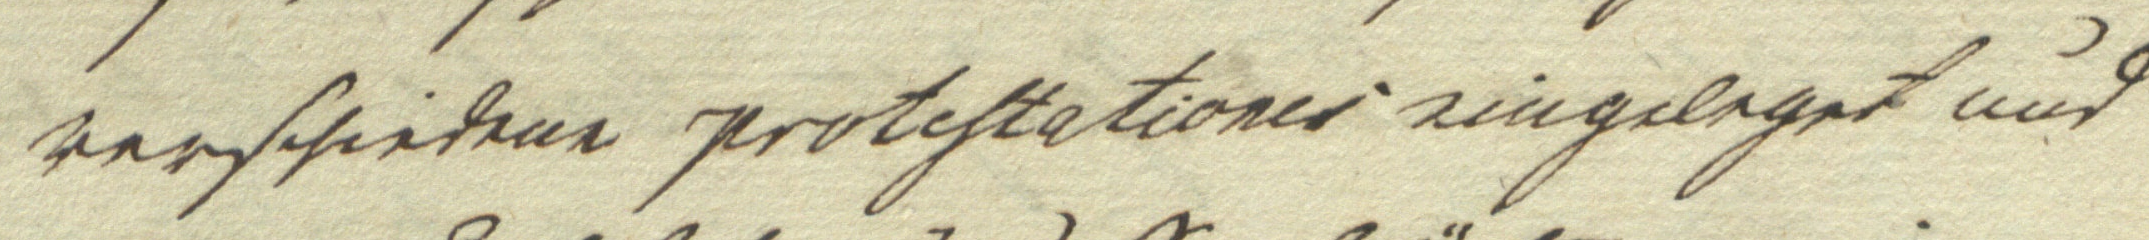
verschiedene protestationes eingeleget und
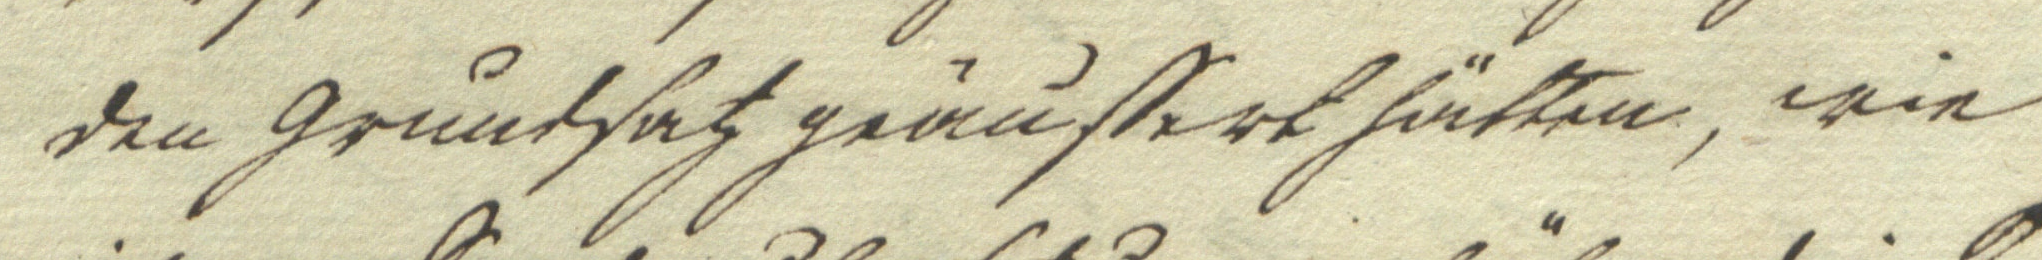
den Grundsatz geäussert hätten, wie
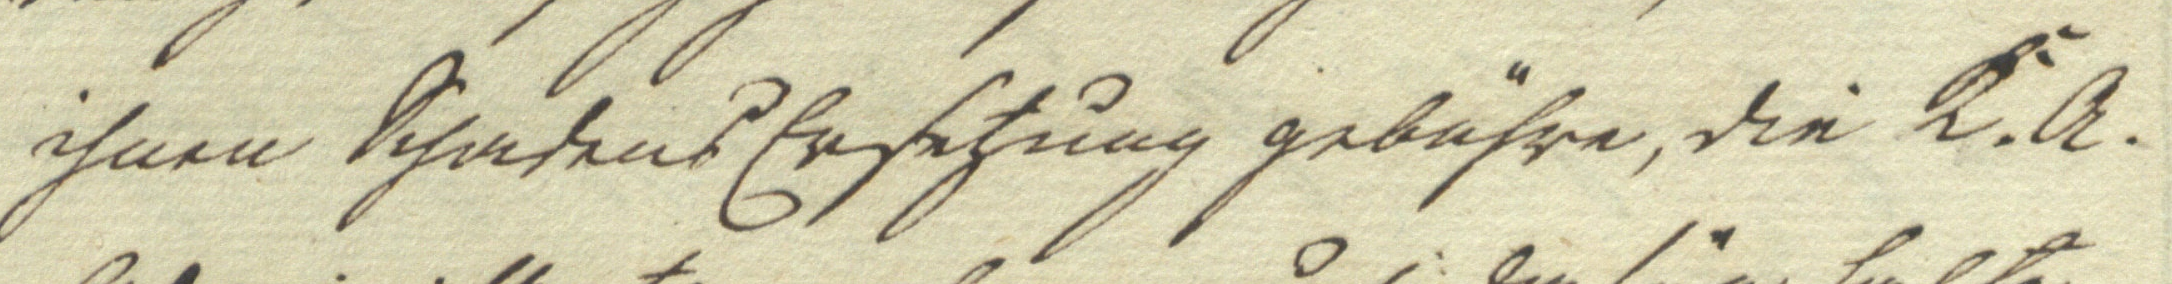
ihnen Schadens Ersetzung gebühre, die K. A.
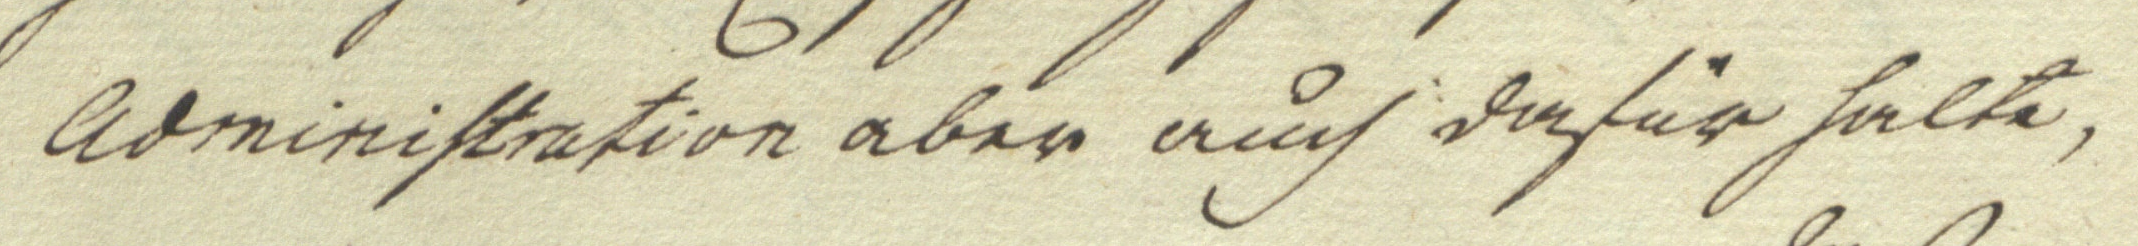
Administration aber auch dafür halte,
